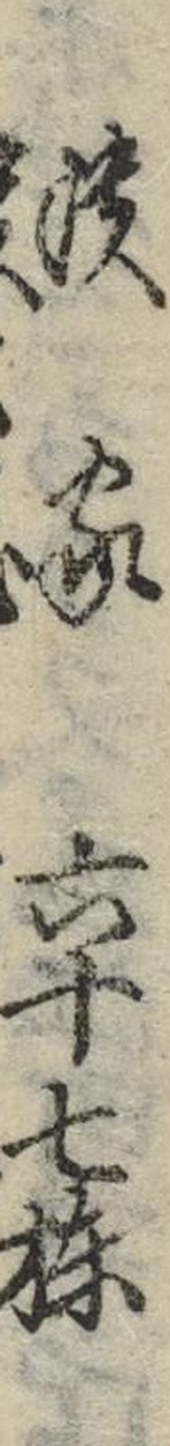潰家六十七棟
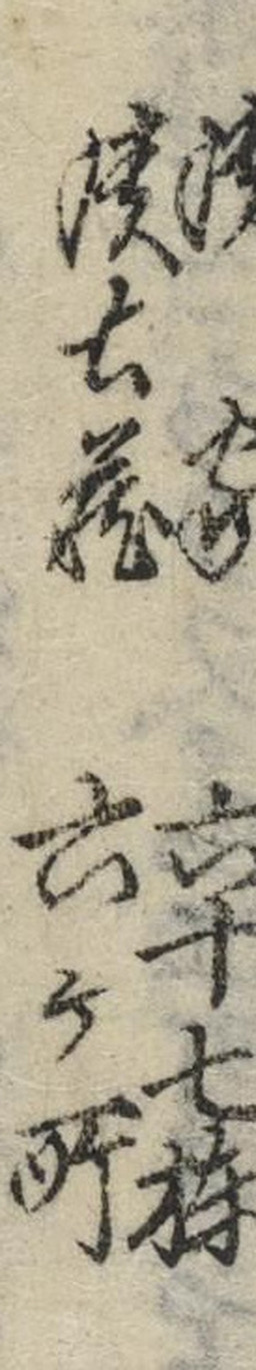潰土蔵六ケ所
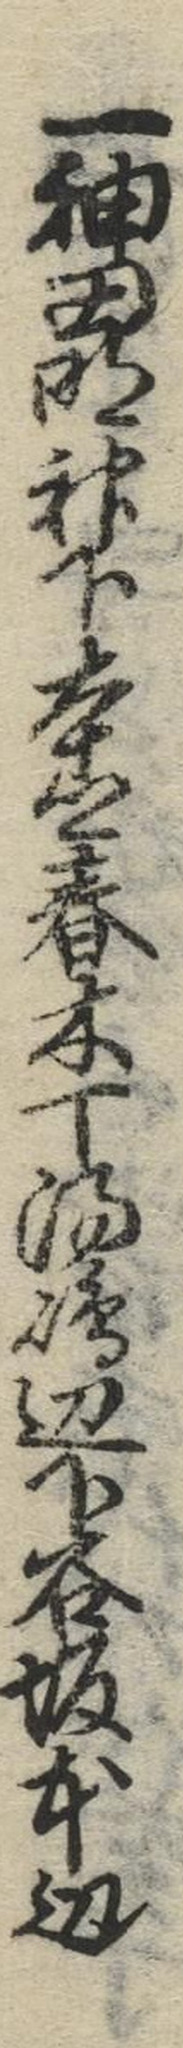一神田明神下本郷春木丁湯嶋辺下谷坂本辺
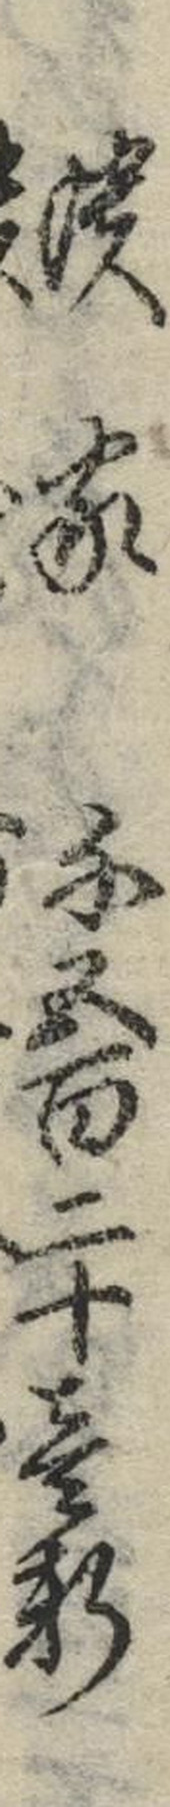潰家千五百二十壱軒
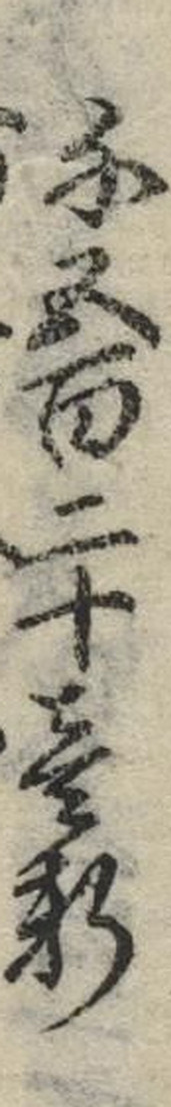潰家千五百二十壱軒
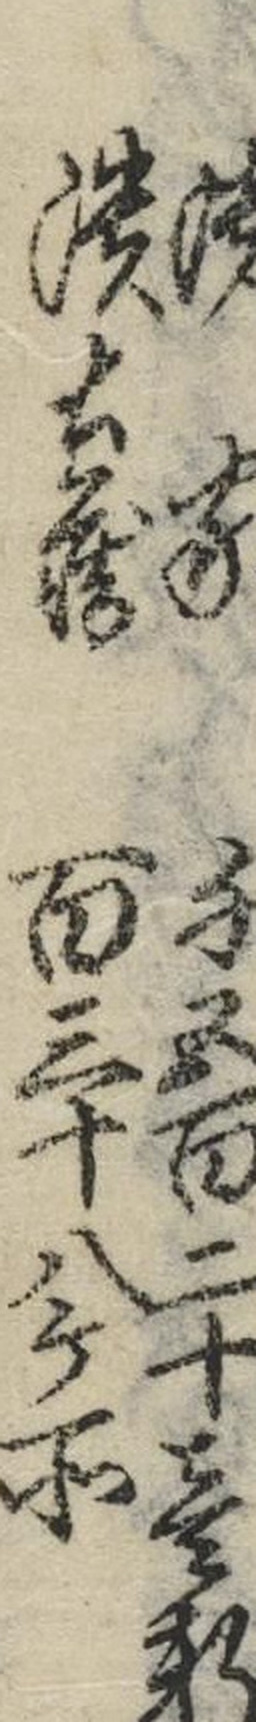潰土蔵百三十八ケ所
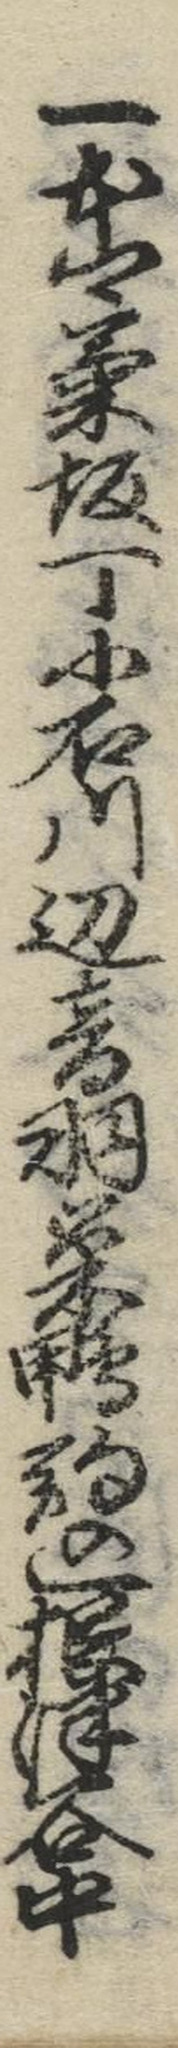一本郷菊坂丁小石川辺音羽巣鴨駒込根津谷中
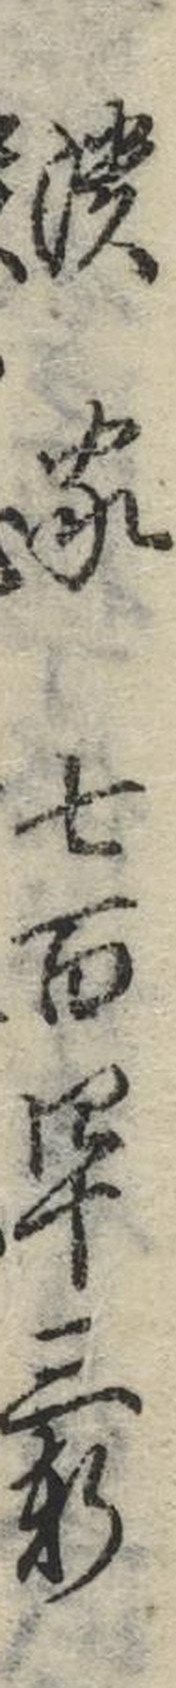潰家七百四十三軒
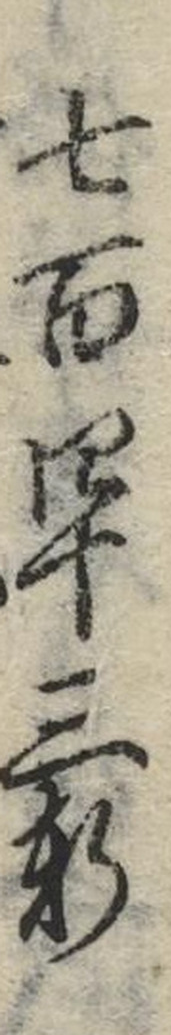潰家七百四十三軒
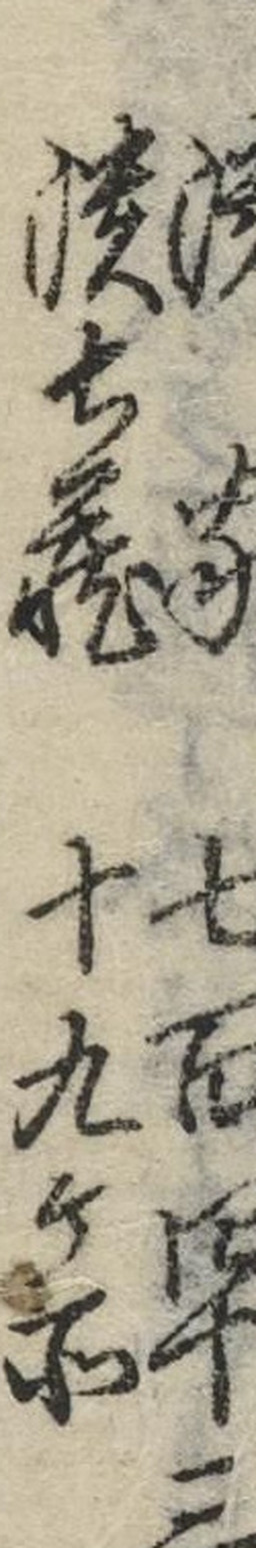潰土蔵十九ケ所
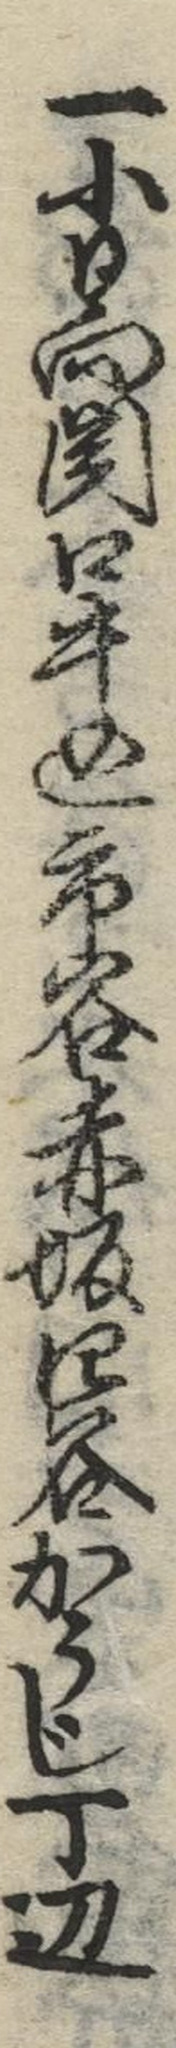一小日向関口牛込市谷赤坂四谷かうじ丁辺
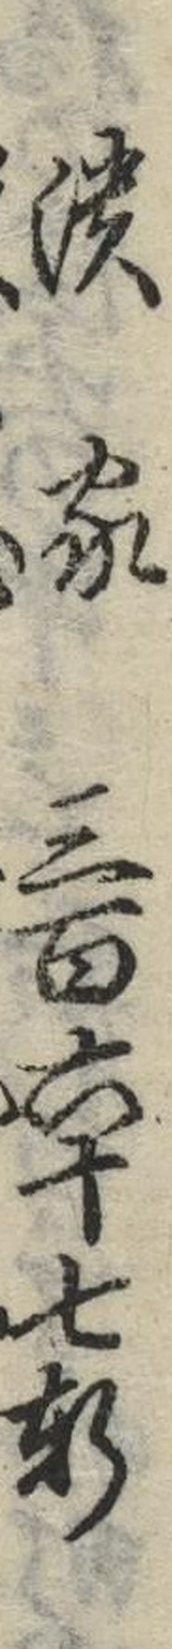潰家三百六十七軒
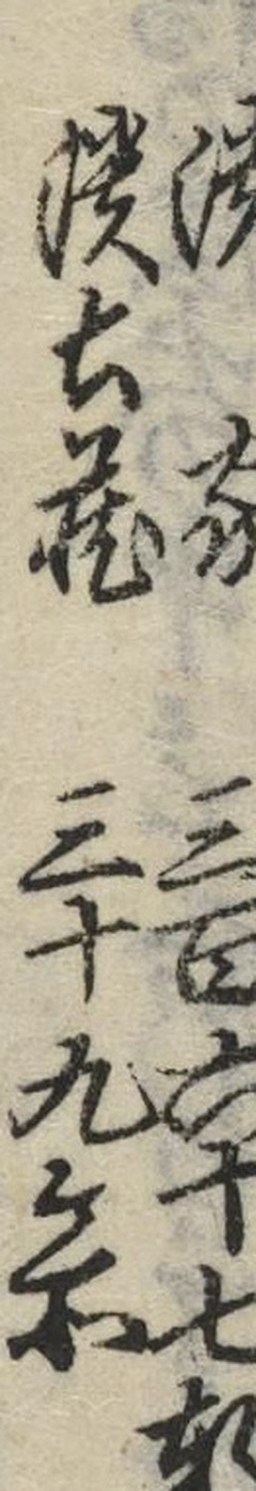潰土蔵三十九ケ所
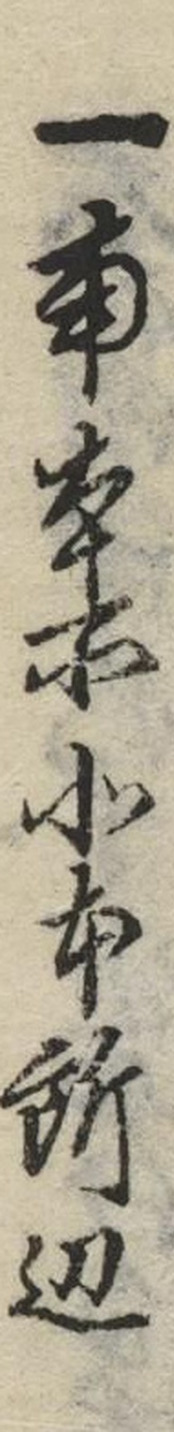一南本所北本所辺
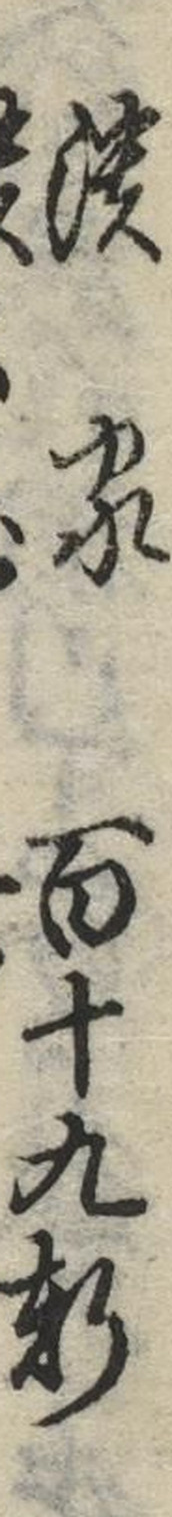潰家百十九軒
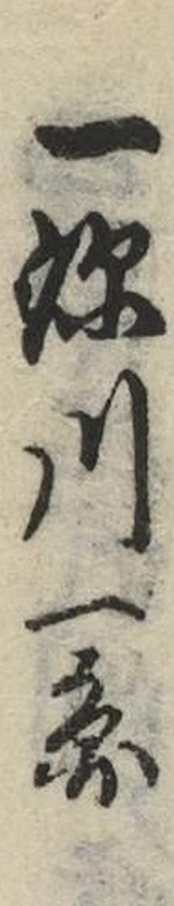一深川一円
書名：江戸御屋鋪方町方共　地震類焼場所巨細書之寫　潰家潰土蔵共取調附街道筋近在迄
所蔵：東京大学地震研究所図書室 Earthquake Research Institute Library, The University of Tokyo, JAPAN
